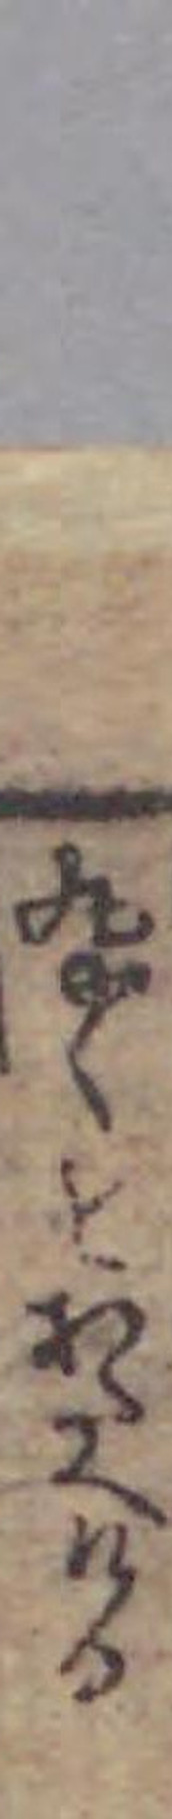丸やくをあたへける
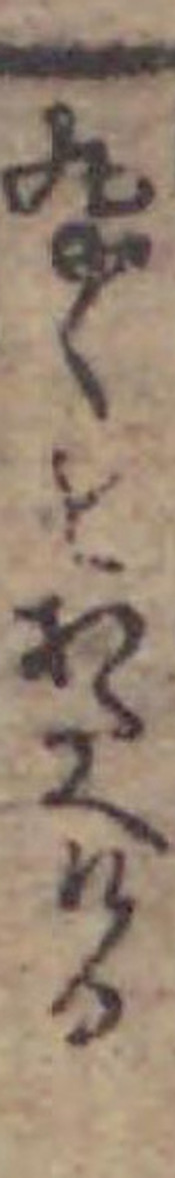丸やくをあたへける
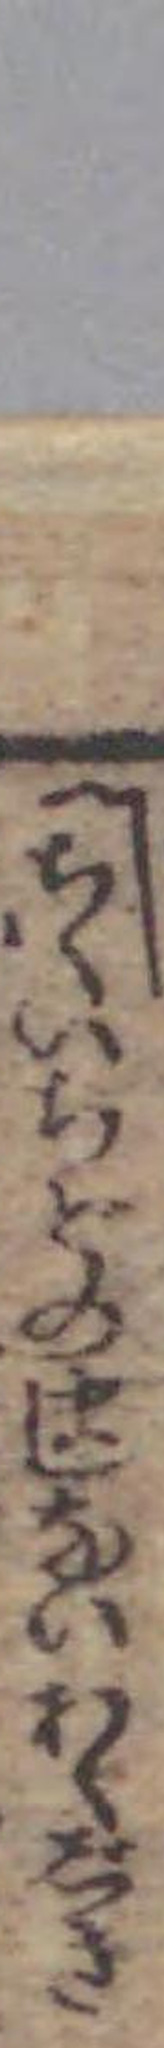〽ちくいちどのましないあくじき
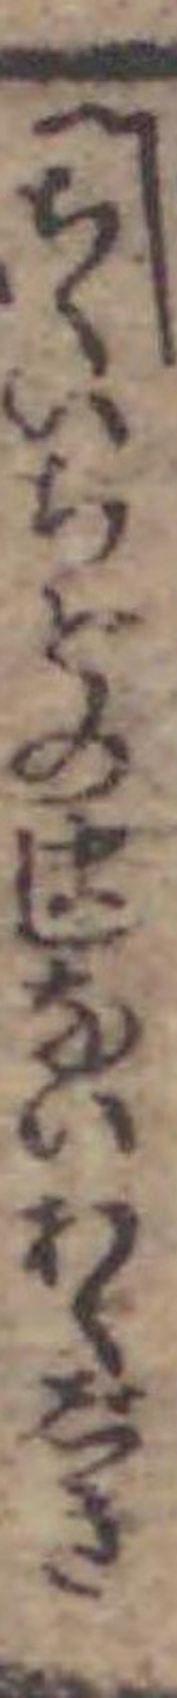〽ちくいちどのましないあくじき
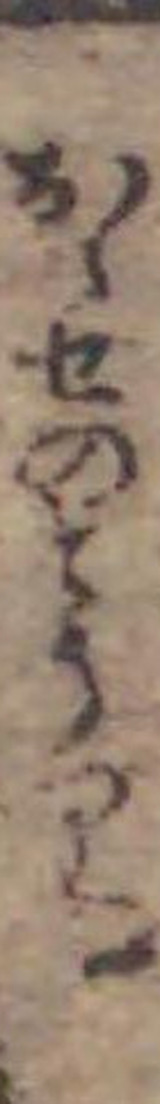おゝせのとうり
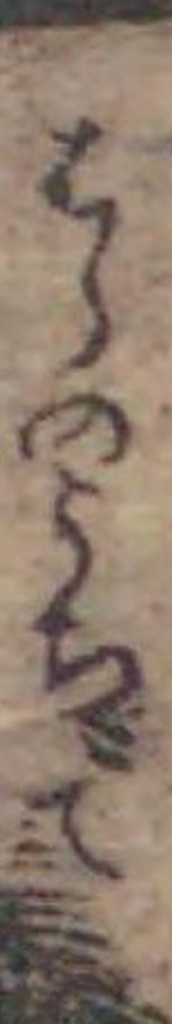はらのうちにて
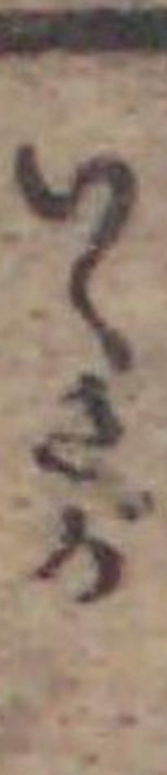いくさが
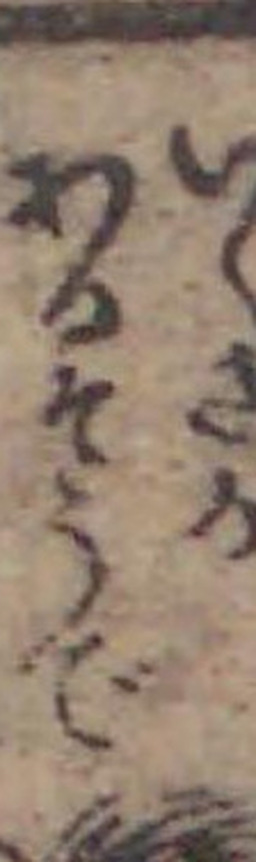あるそうで
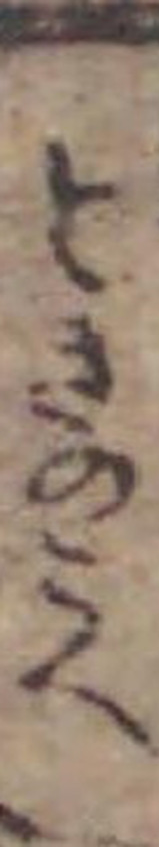ときのこへ
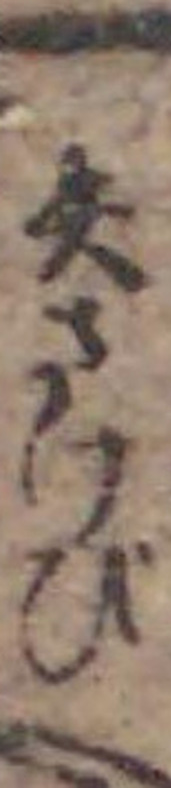矢さけび
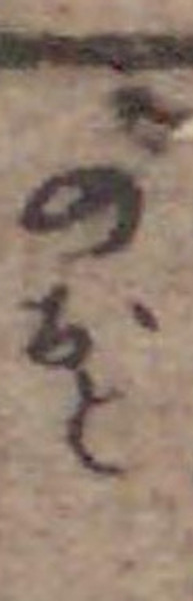のおと
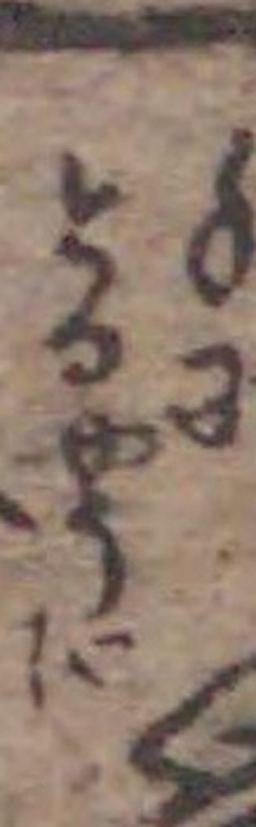とるやうに
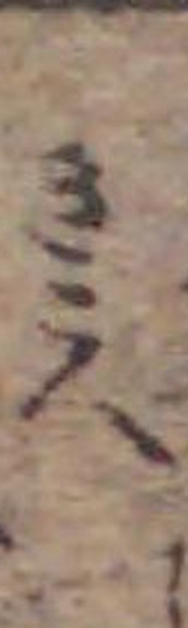きこへ

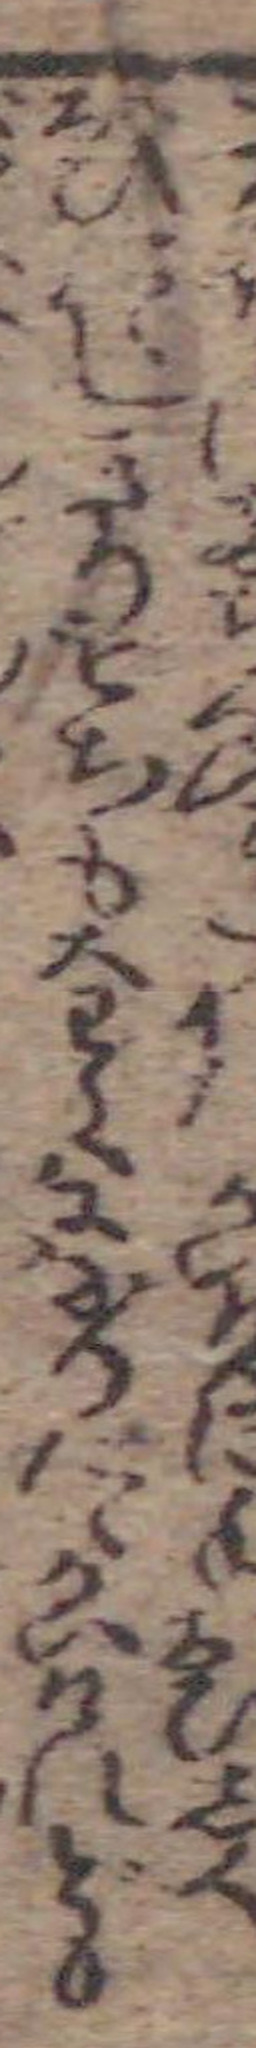おひたゝしきりもちも大わらはになりたゝかいけれども
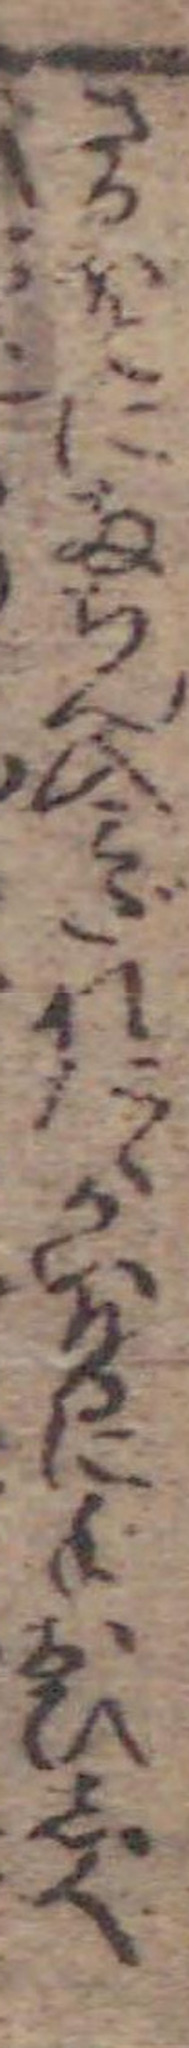さるほどに両ちん入みだれたゝかいけるに手おひし人
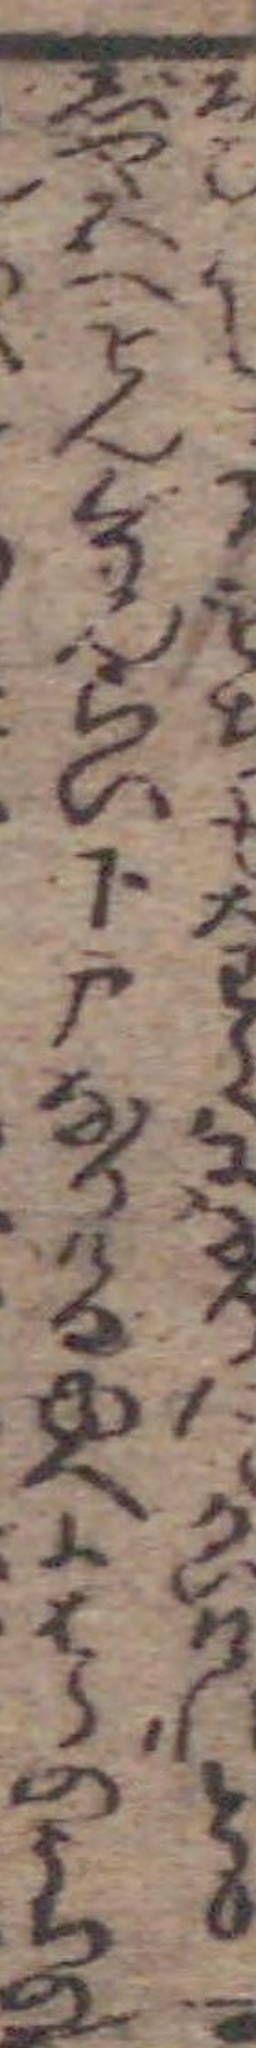じや五へもんぐわんらい下戸なりけるゆへにはらのうちの
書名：腹京師食物合戦 : 2巻
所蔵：国立国会図書館 National Diet Library, JAPAN
